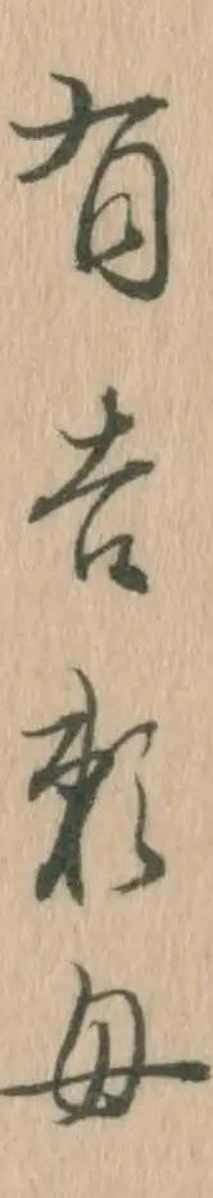有吉頼母
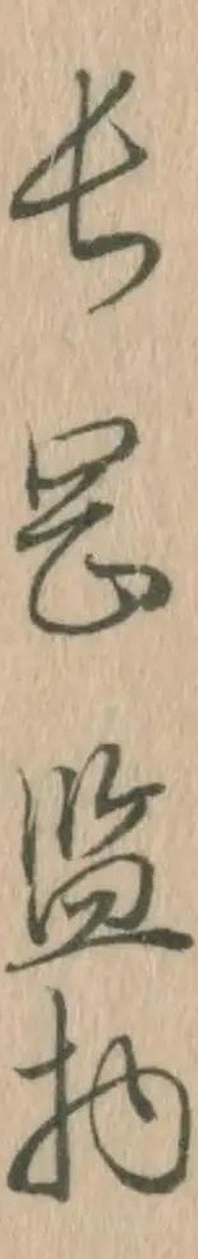長岡監物
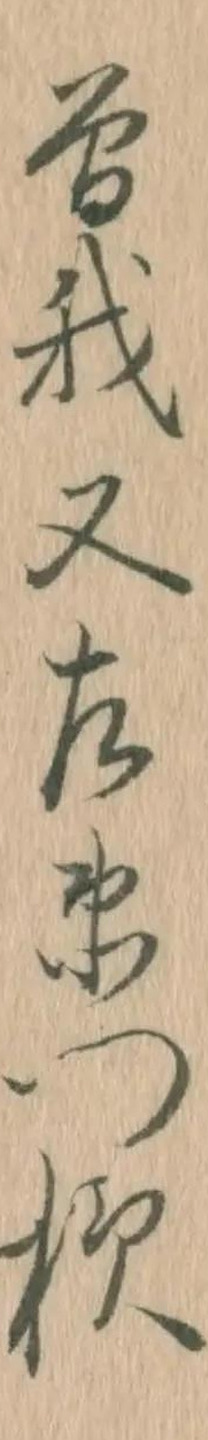曽我又左衛門様

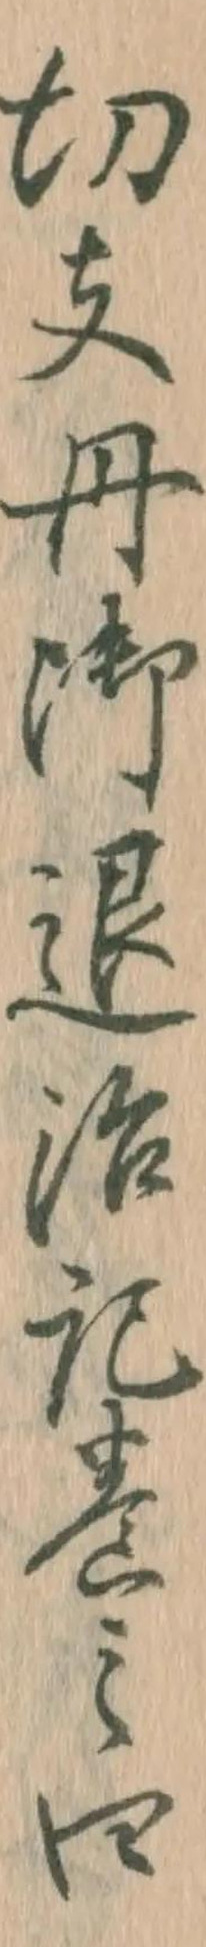切支丹御退治記巻之四
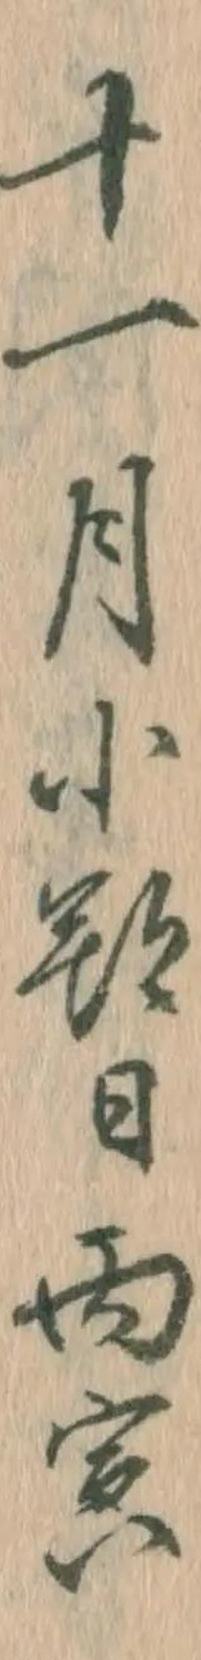十一月小朔日丙寅
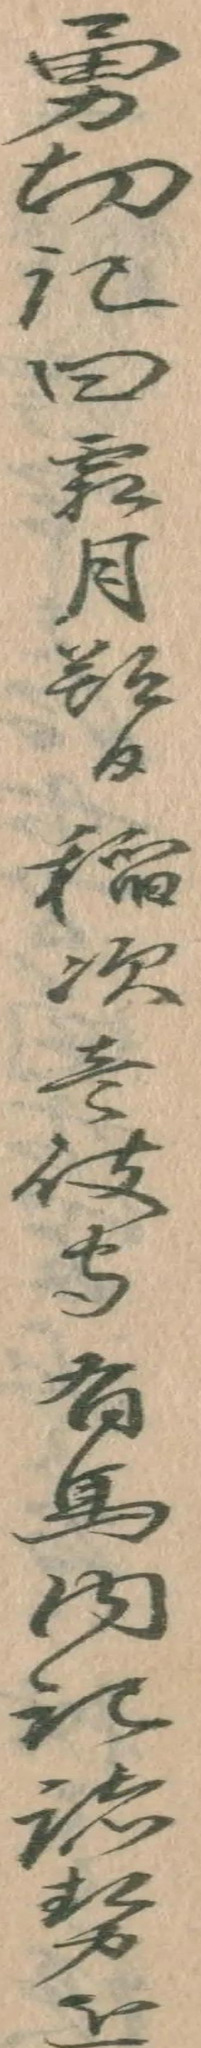勇切記曰霜月朔日稲次壱岐守有馬内記諸勢を
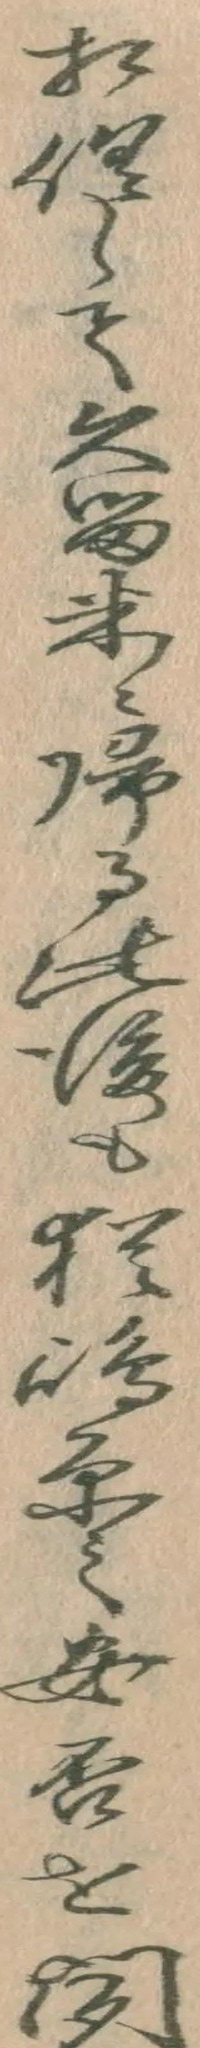相俱して久留米に帰る此後も猶島原之安否を聞
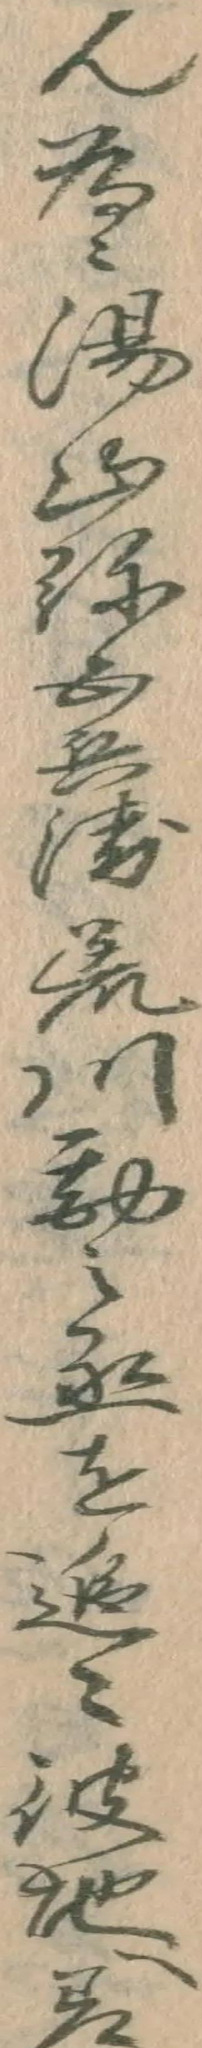ん為に湯山弥五兵衛荒川勘之丞を追々彼地へ差
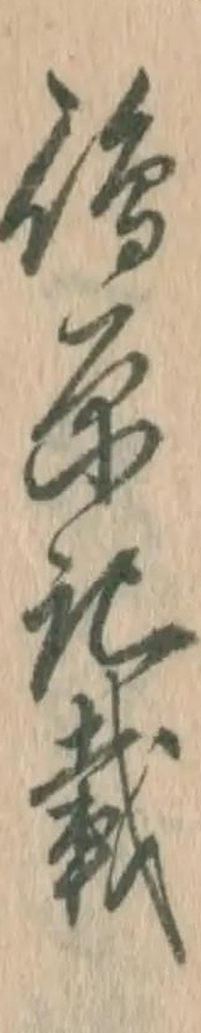島原記載
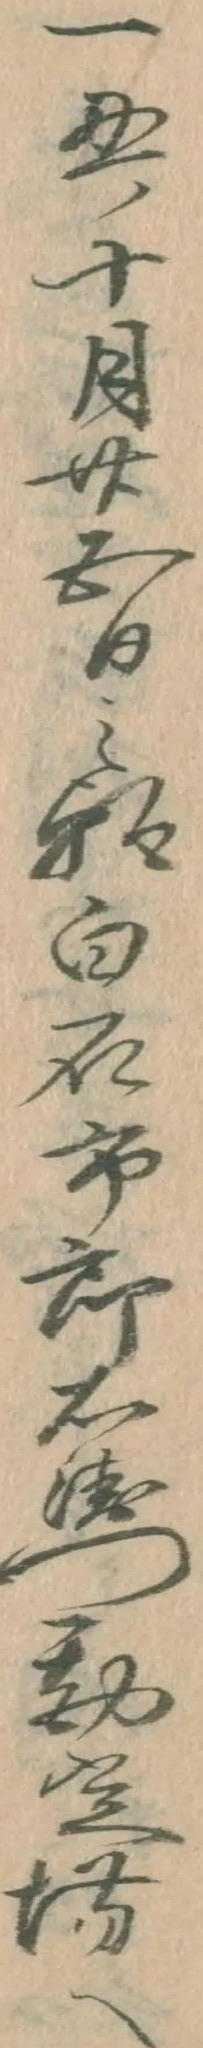一丑之十月廿五日之朝白石市郎右衛門勘定場へ

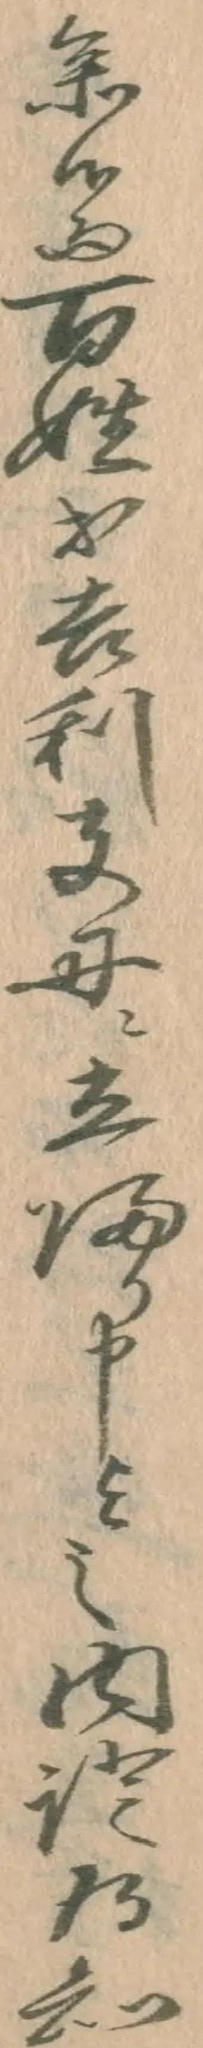参候而百姓等吉利支丹に立帰り申与之内證為知
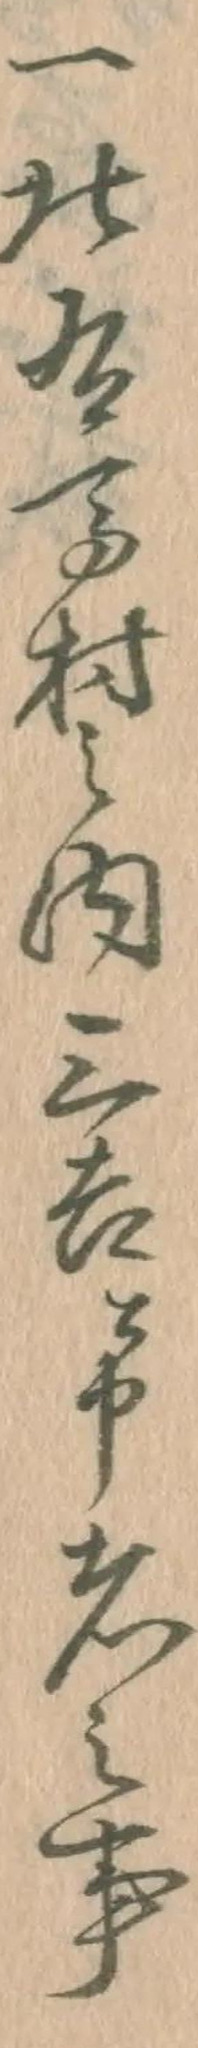一北有馬村之内三吉と申者之事
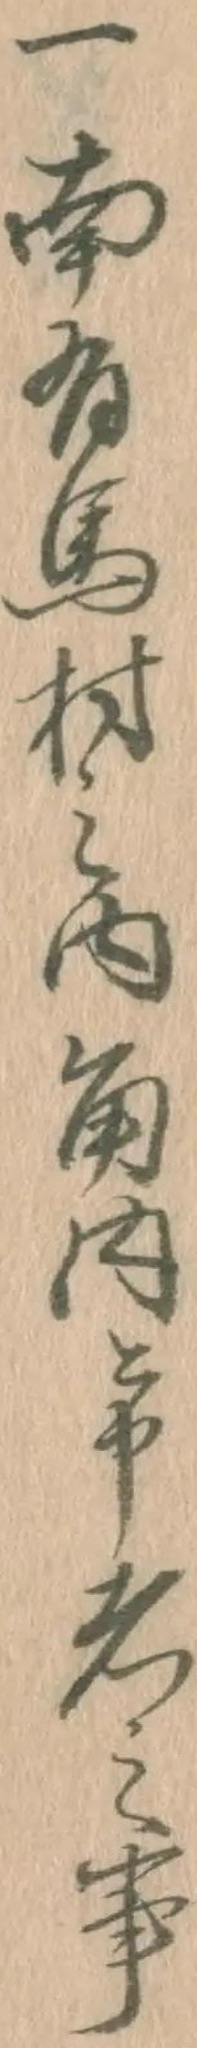一南有馬村之内角内と申者之事
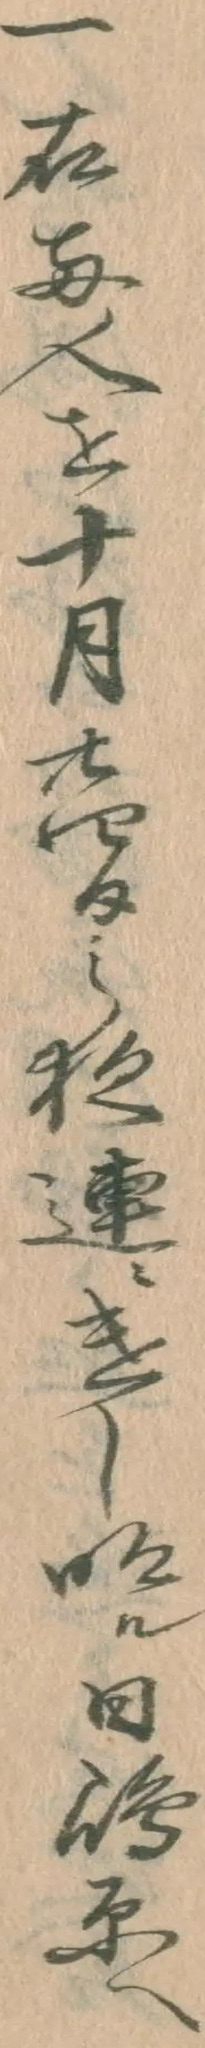一右両人を十月廿四日之夜連に遣し明る日島原へ
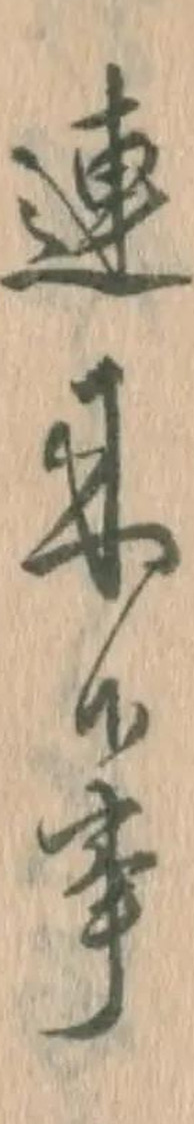連来候事
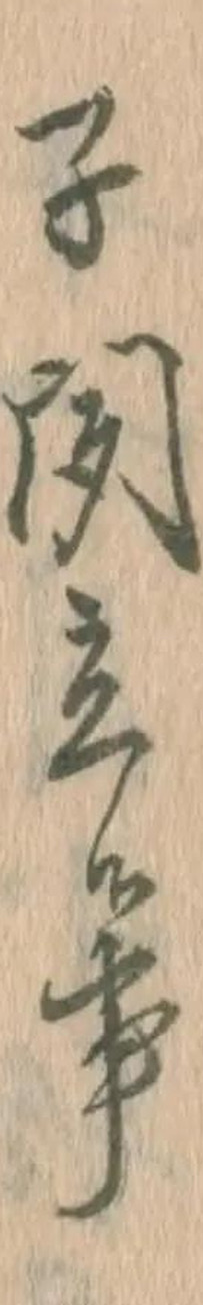子聞立候事
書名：切支丹御退治記 49巻. [2]
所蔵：国立国会図書館 National Diet Library, JAPAN
